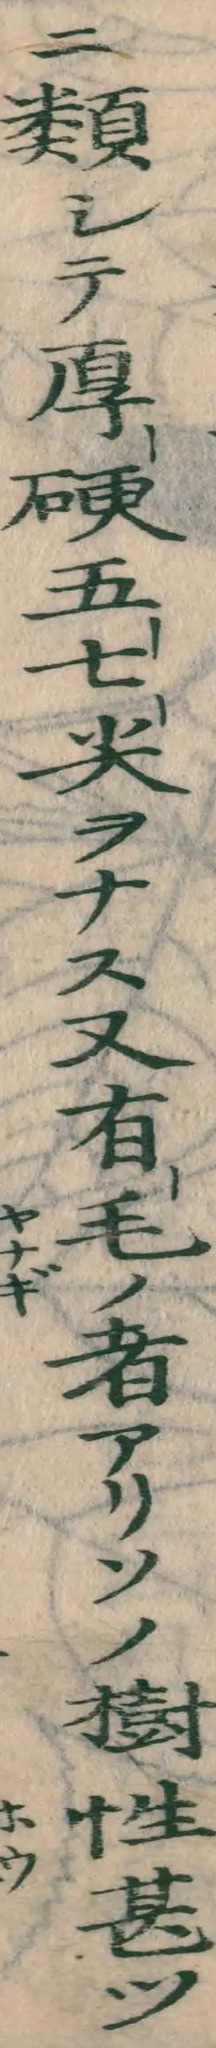ニ類シテ厚-硬五-七-尖ヲナス又有-毛ノ者アリソノ樹性甚ツ
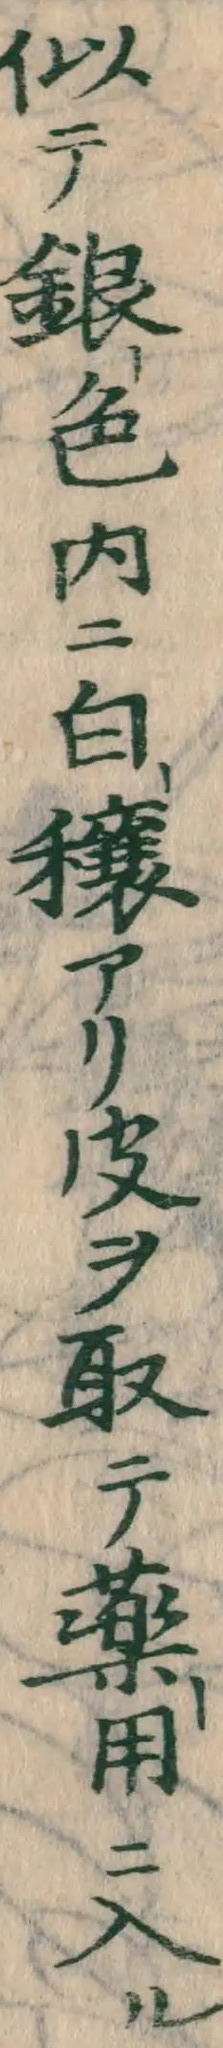似テ銀-色内ニ白-穣アリ皮ヲ取テ薬-用ニ入ル
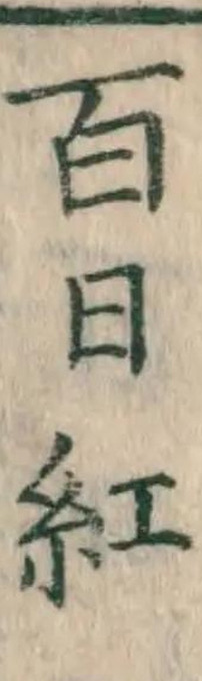百日紅

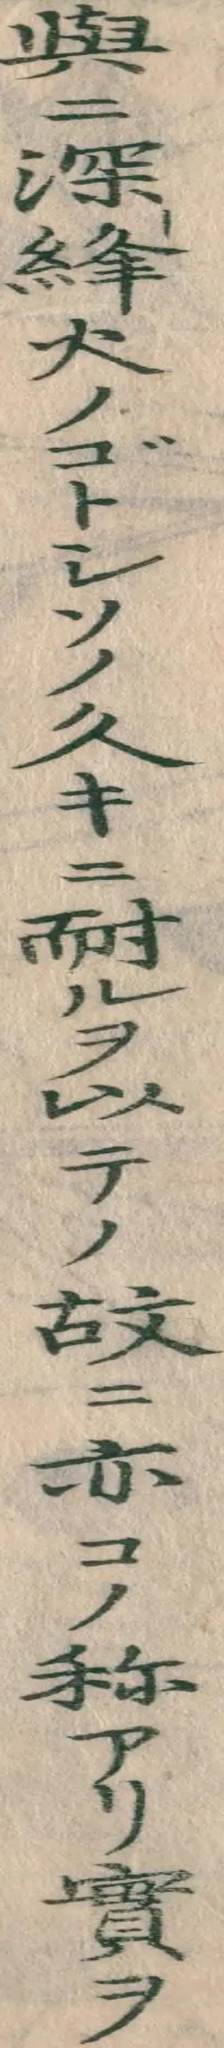与ニ深-絳火ノゴトシソノ久キニ耐ルヲ以テノ故ニ亦コノ称アリ実ヲ
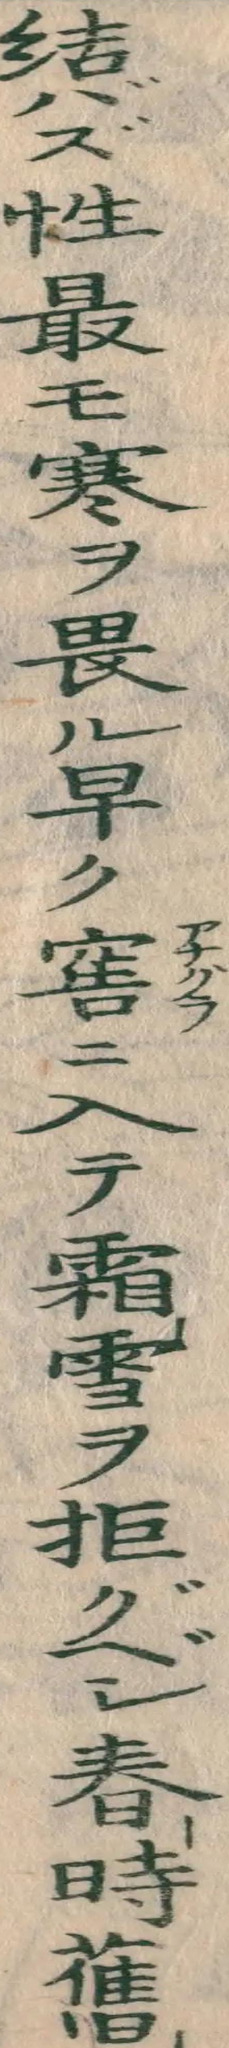結バズ性最モ寒ヲ畏ル早ク窖ニ入テ霜-雪ヲ拒グベシ春-時旧-
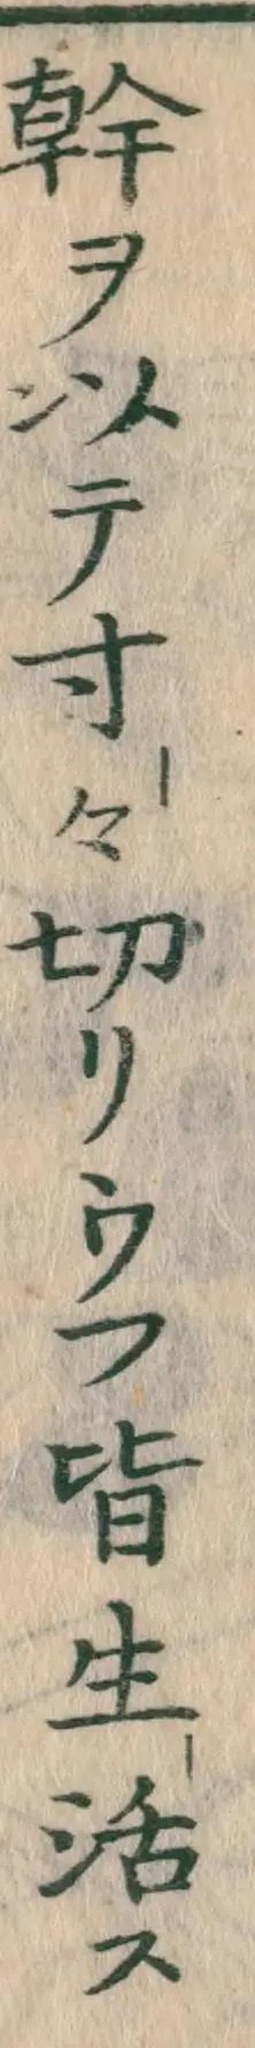幹ヲ以テ寸-々切リウフ皆生-活ス

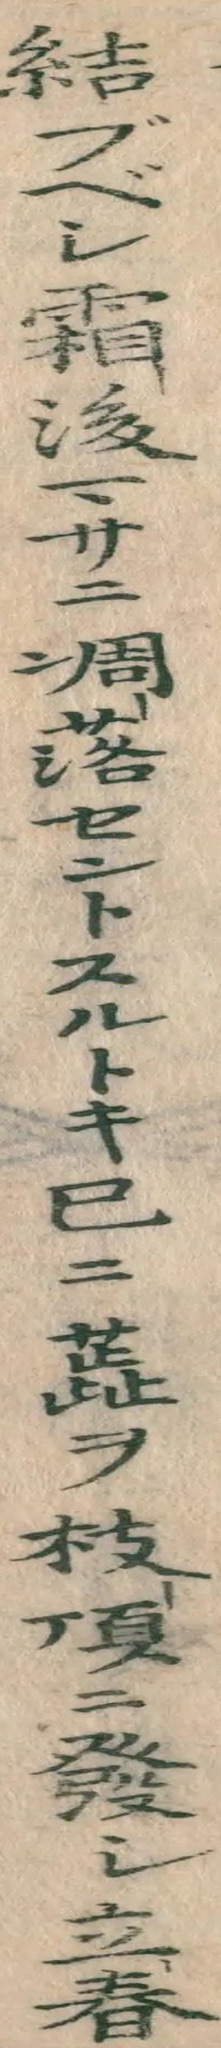結ブベシ霜-後マサニ凋-落セントスルトキ已ニ蕊ヲ枝-頂ニ発シ立-春
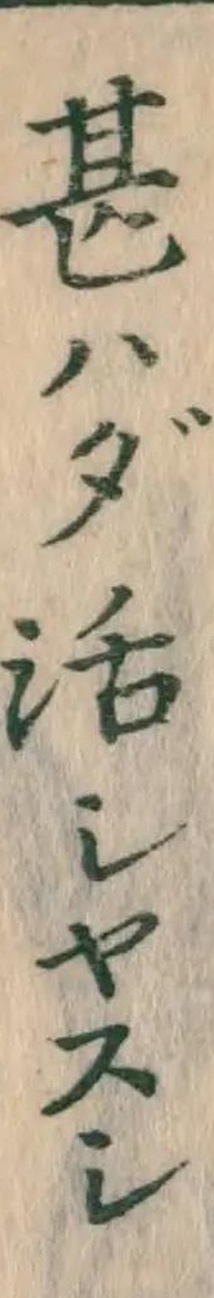甚ハダ活シヤスシ
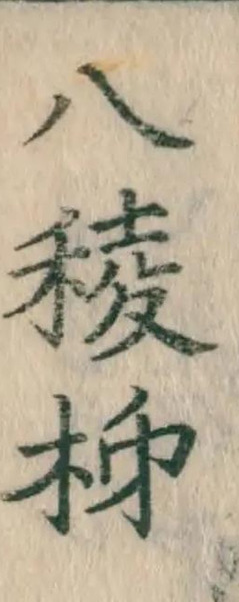八稜柿

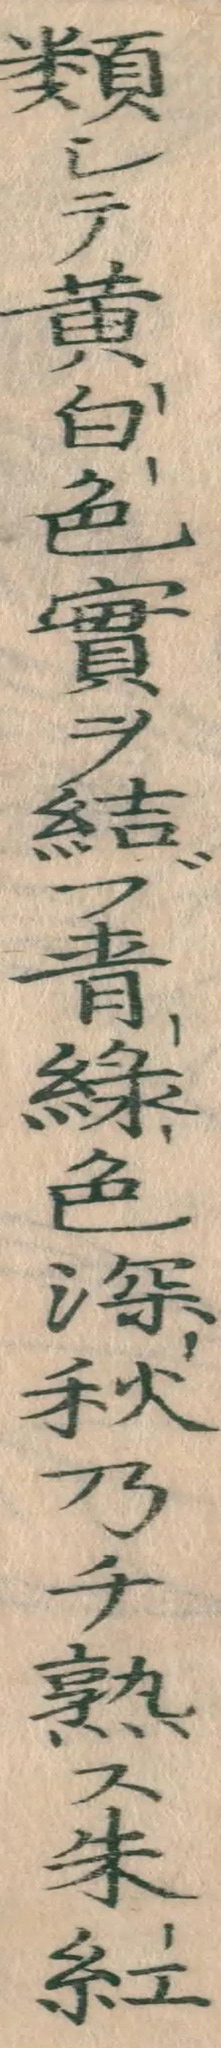類シテ黄-白-色実ヲ結ブ青-緑-色深-秋乃チ熟ス朱-紅
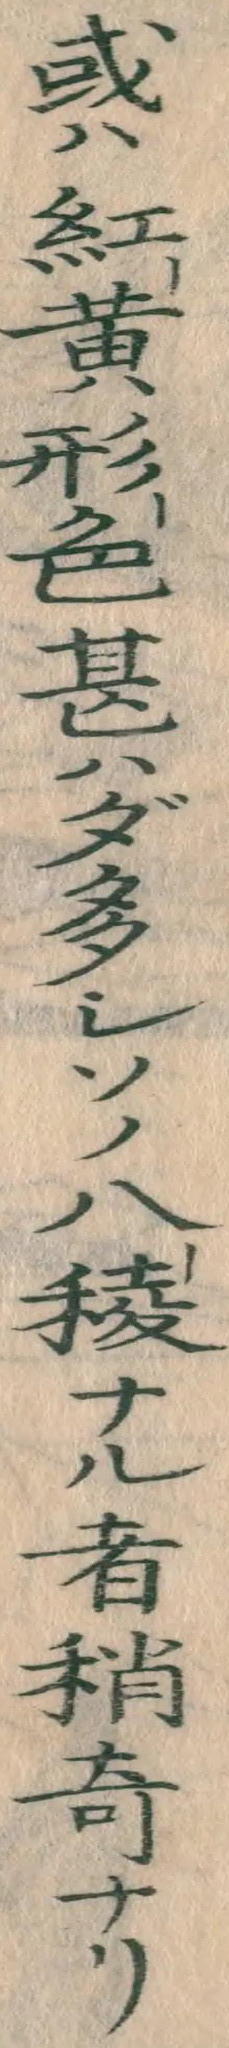或ハ紅-黄形-色甚ハダ多シソノ八-稜ナル者稍奇ナリ
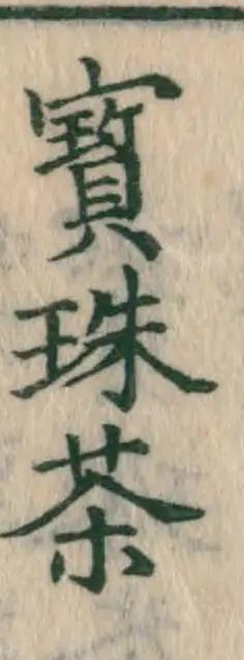宝珠茶

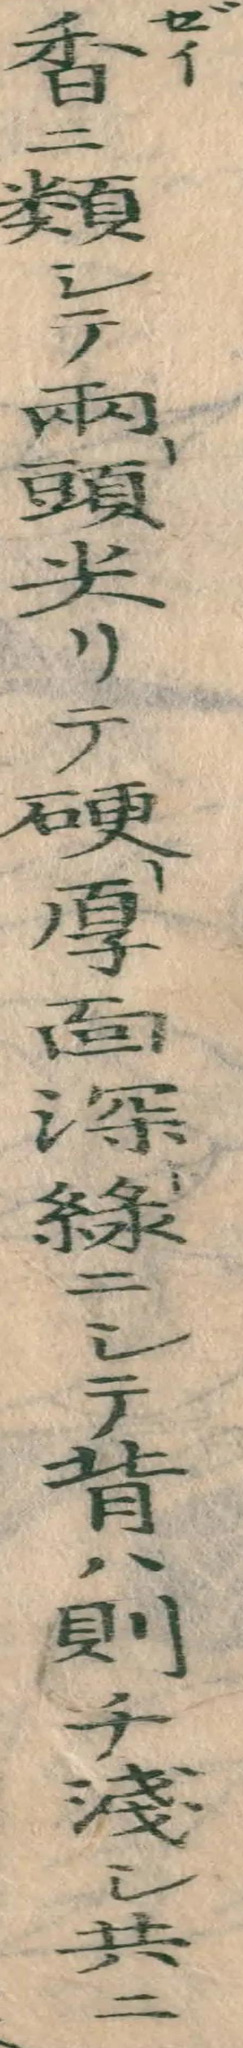香ニ類シテ両-頭尖リテ硬-厚面深-緑ニシテ背ハ則チ浅シ共ニ
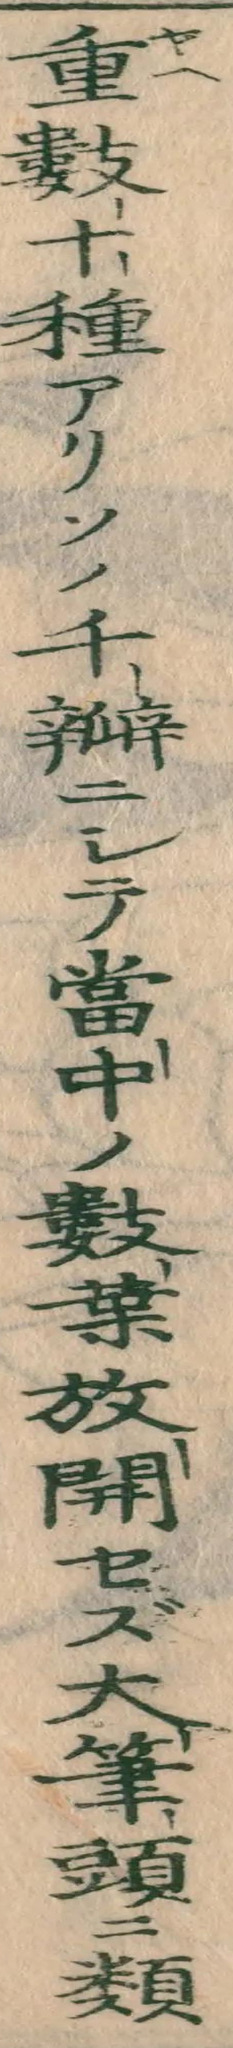重数-十-種アリソノ千-弁ニシテ当-中ノ数-葉放-開セズ大-筆-頭ニ類
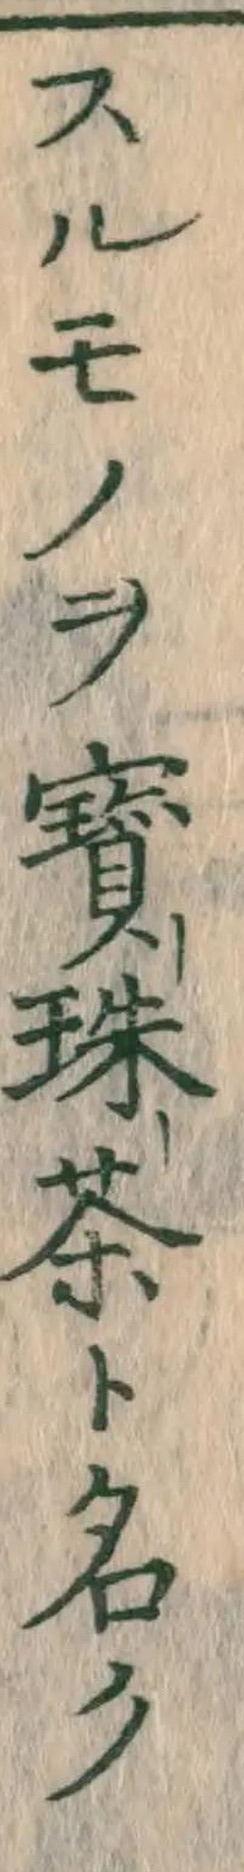スルモノヲ宝-珠-茶ト名ク
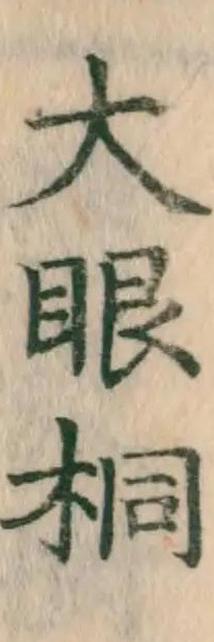大眼桐
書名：花彙 草部4巻木部4巻. [2]
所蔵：国立国会図書館 National Diet Library, JAPAN
